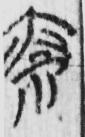○（夕）
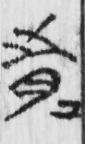之月
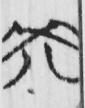癸
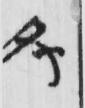丑
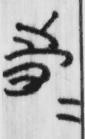之日
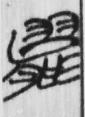○（一）
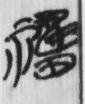禱
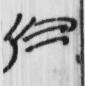於
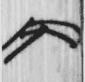文
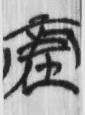坪（平）
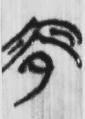○（夜）
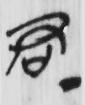君
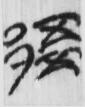郚
